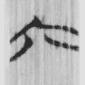六
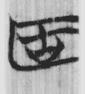{匚古}
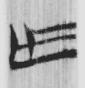乍
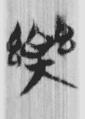樂
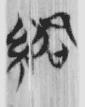{紹卩}
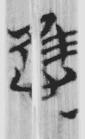{隹心}
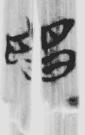{母日}
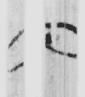內
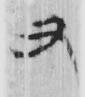又
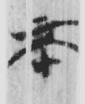不
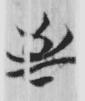至
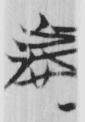者
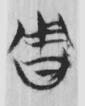周
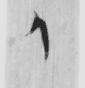人
